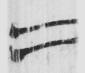二
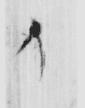人
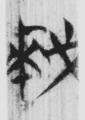{戈戈}
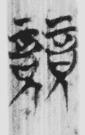競
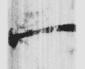一
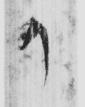人
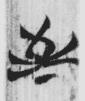至
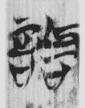詒
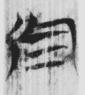於
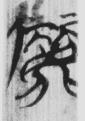儷
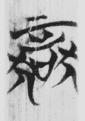獄
